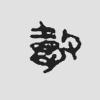{𣪊子}
